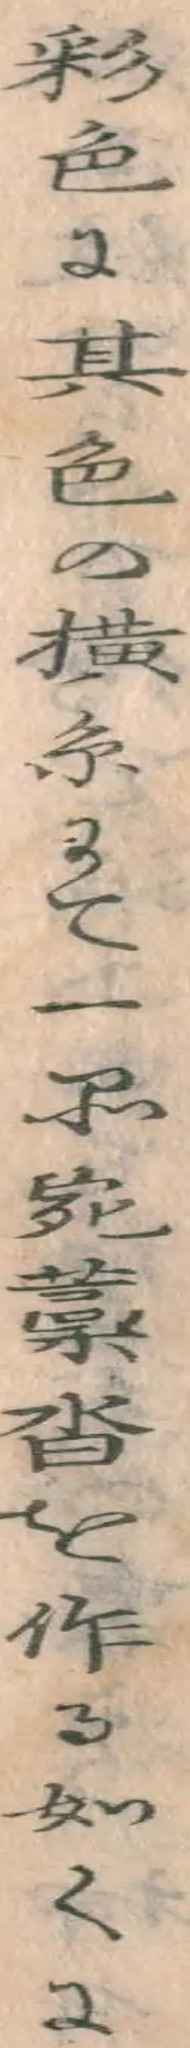彩色に其色の横糸にて一品宛藁沓を作る如くに
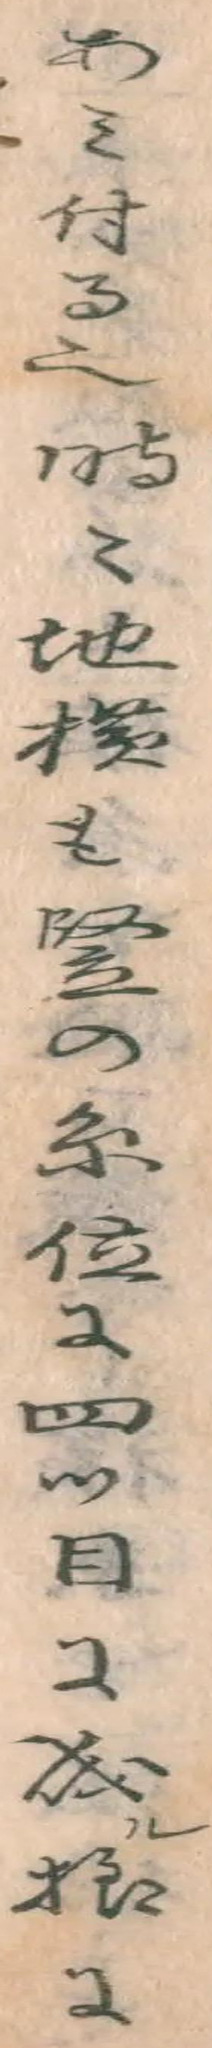あみ付る也時々地横も竪の糸位に四ッ目に成る様に
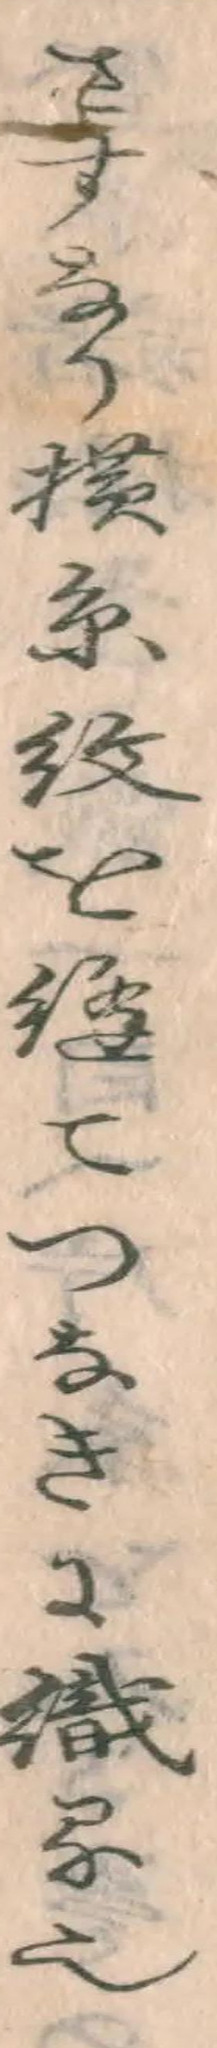さすなり横糸紋を縫てつなきに織る也
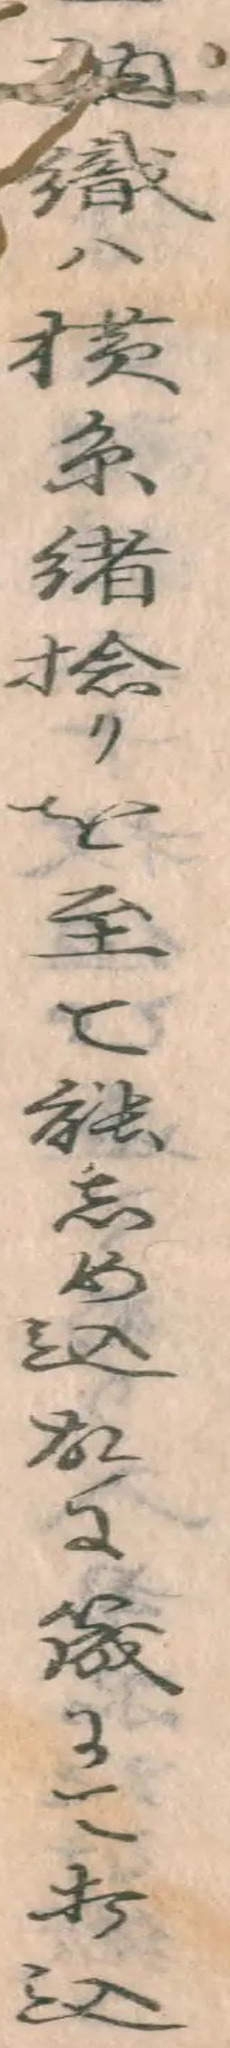一衲織は横糸緒捻りを至て能しめ込故に筬にて打込
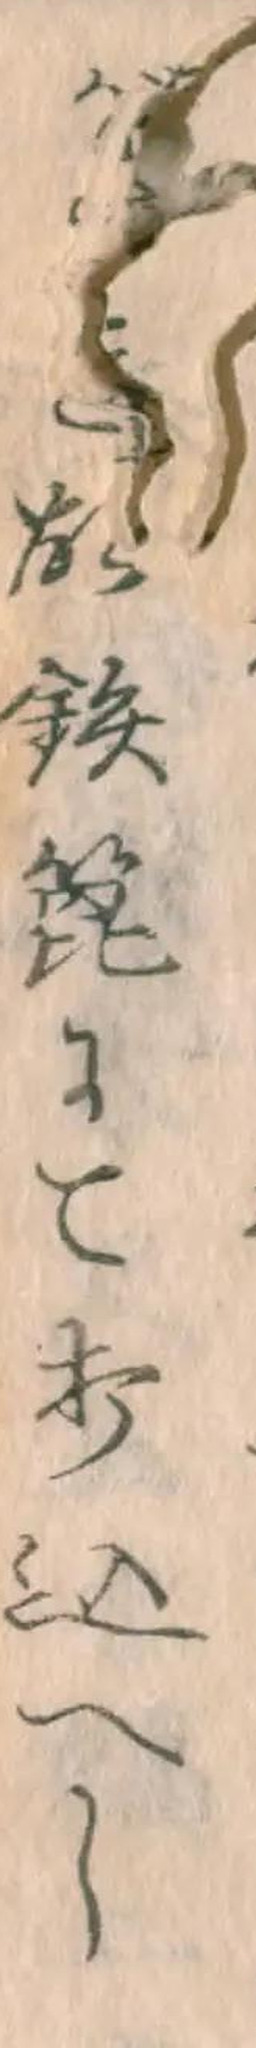がたき故鉄箆にて打込へし
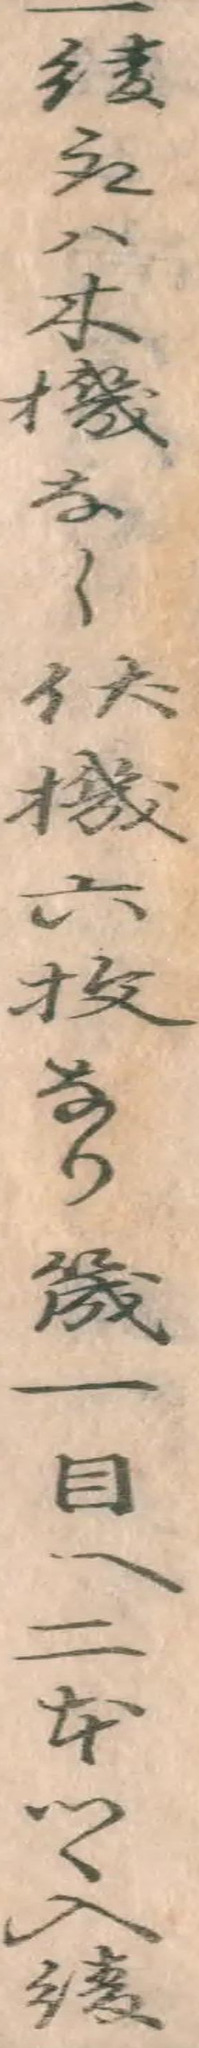一綾取は木機なし伏機六枚なり筬一目へ二本つゝ入綾
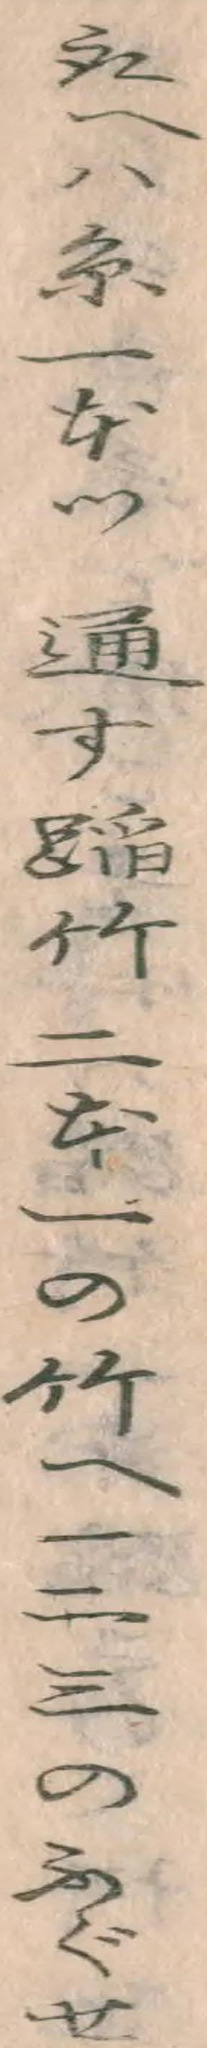取へは糸一本つ通す蹈竹二本一の竹へ一二三のふぐせ
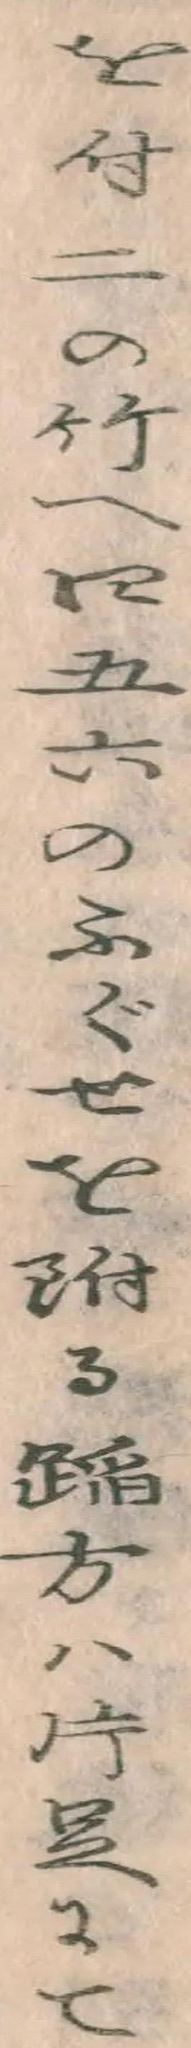を付二の竹へ四五六のふぐせを附る蹈方は片足にて
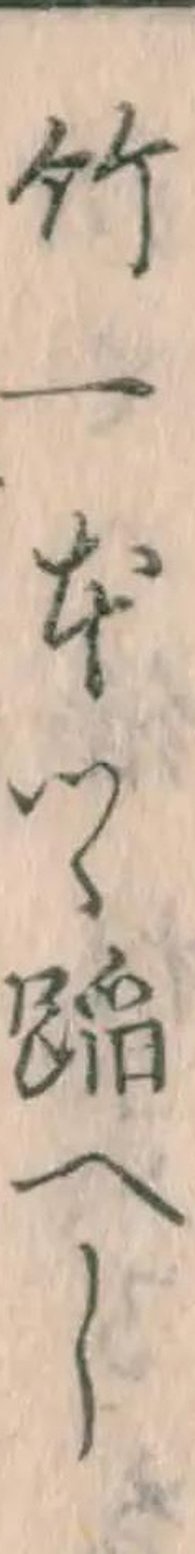竹一本つゝ蹈へし
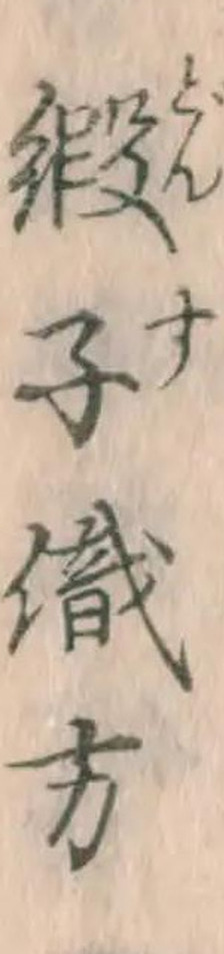緞子織方
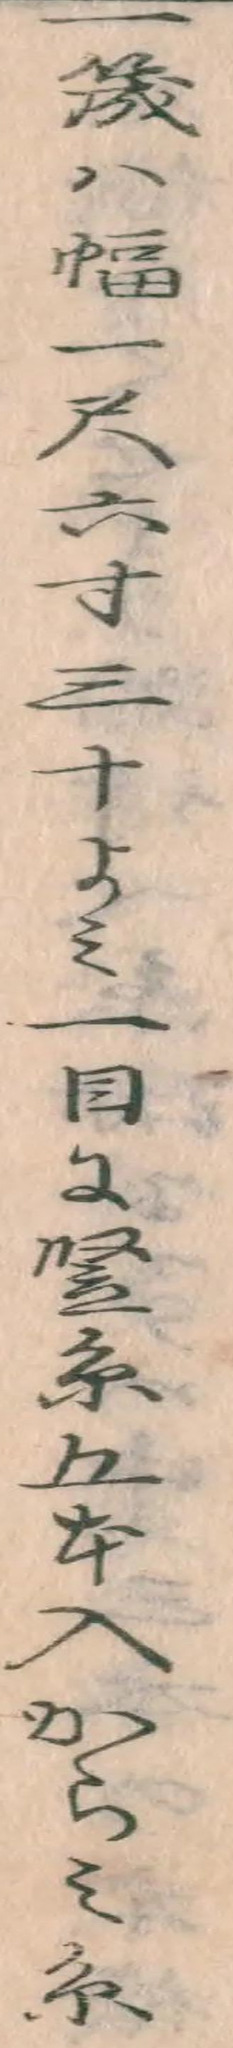一筬は幅一尺六寸三十よみ一目に竪糸五本入からみ糸
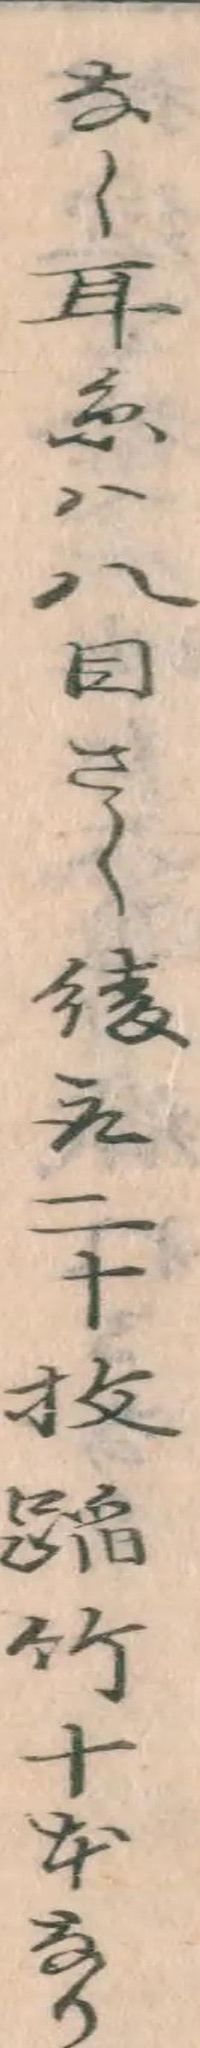なし耳糸は八目さし綾取二十枚蹈竹十本なり
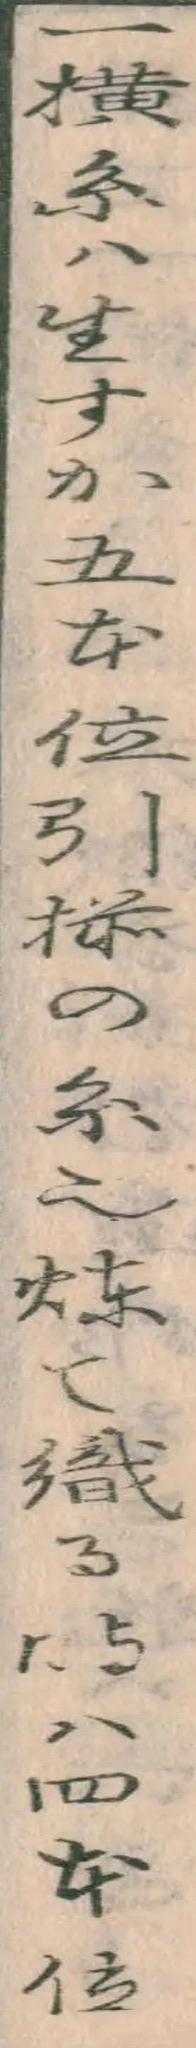一横糸は生すか五本位引揃の糸也煉て織る時は四本位
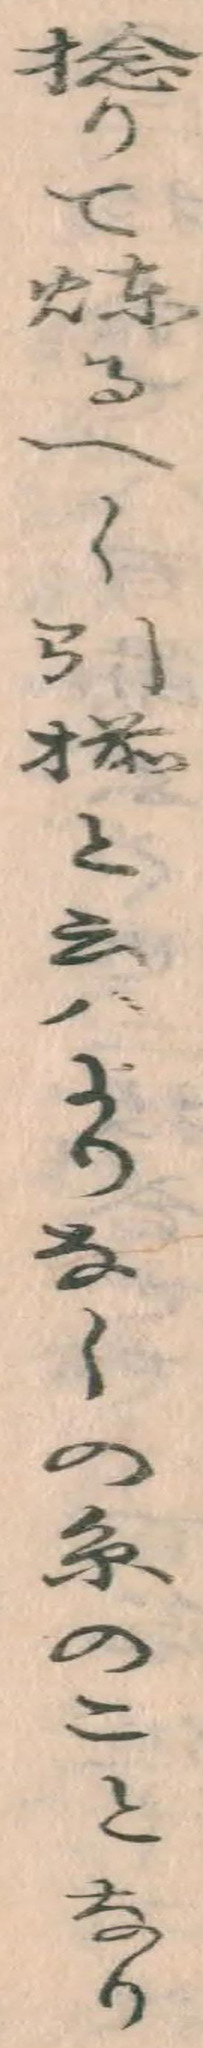捻りて煉るへし引揃と云はよりなしの糸のことなり
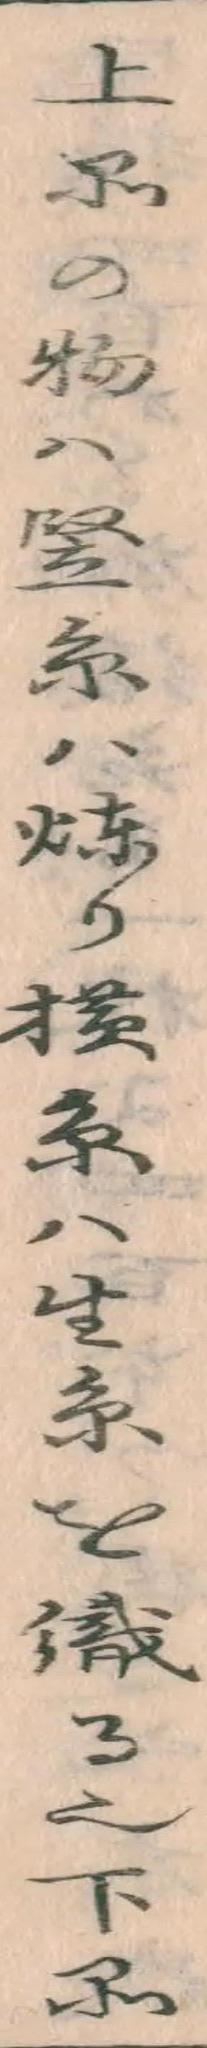上品の物は竪糸は煉り横糸は生糸を織る也下品
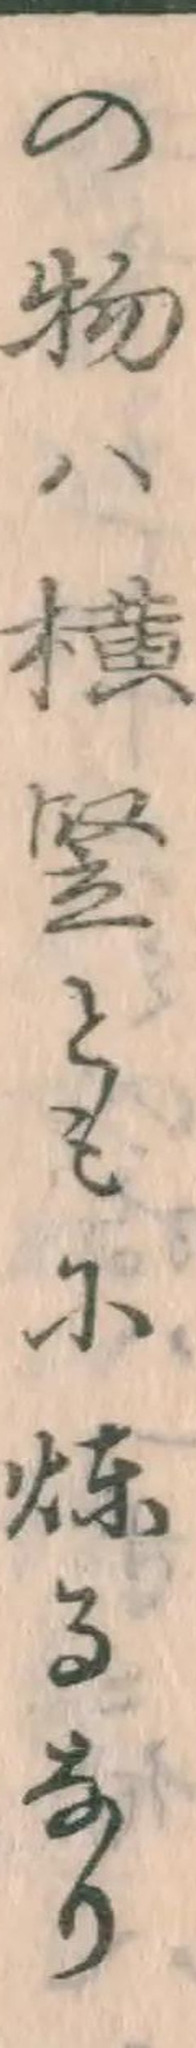の物は横竪ともに煉るなり
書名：機織彙編 5巻. [2]
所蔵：国立国会図書館 National Diet Library, JAPAN
